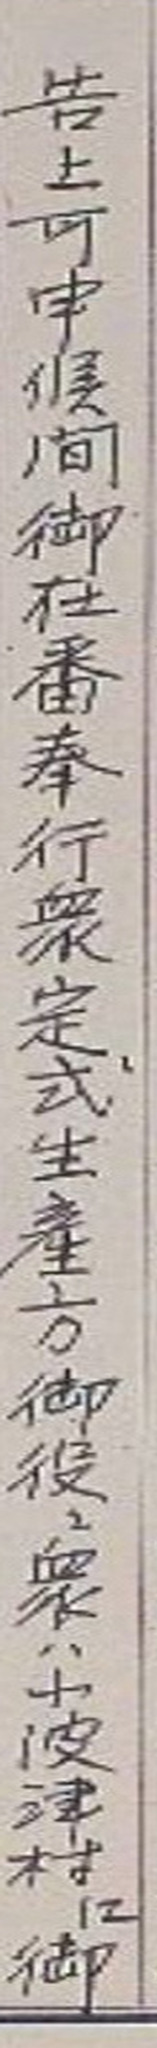告上可申候間御在番奉行衆定式生産方御役々衆は小波津村え御
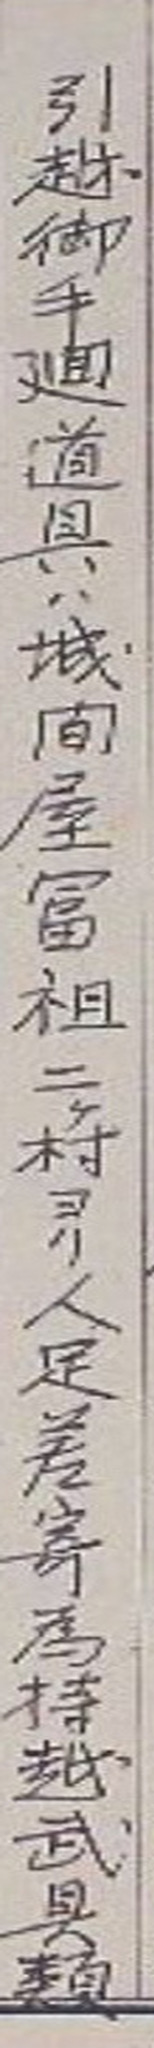引越御手廻道具は城間屋冨祖二ヶ村より人足差寄為持越武具類
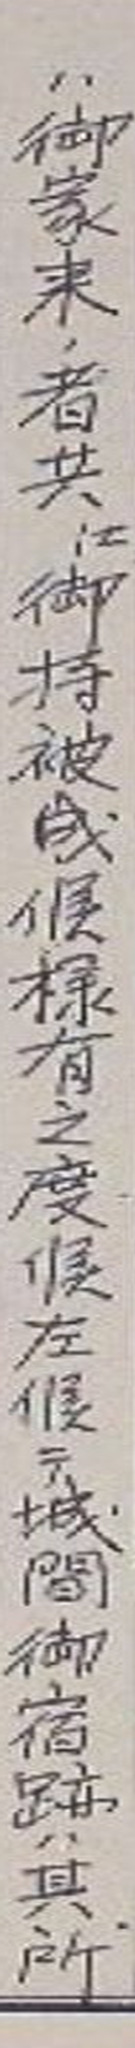は御家来の者共え御持被成候様有之度候左候て城間御宿跡は其所
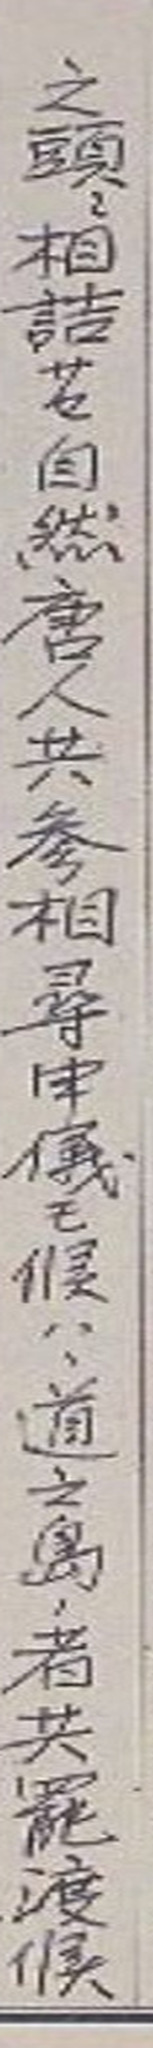之頭々相詰させ自然唐人共参相尋申儀も候はゝ道之島の者共罷渡候
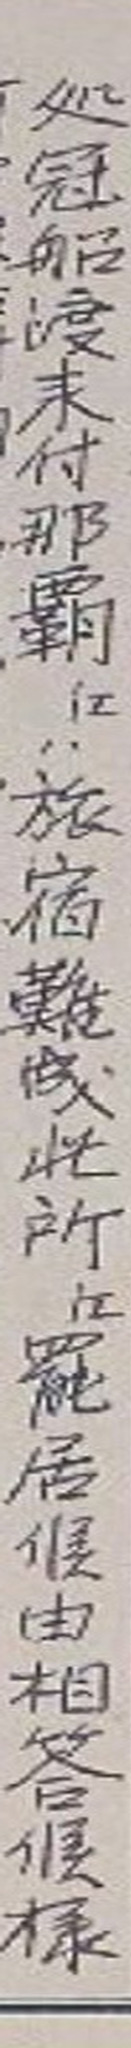処冠船渡来付那覇えは旅宿難成此所え罷居候由相答候様
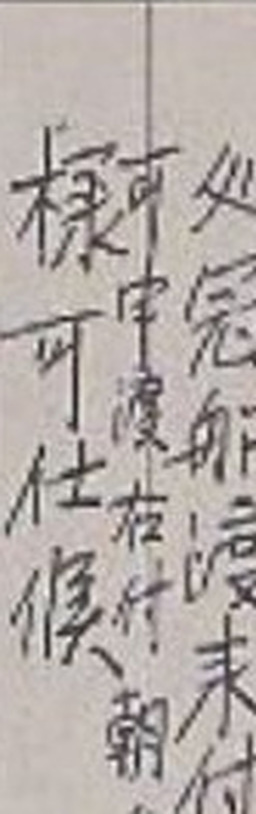様可仕候
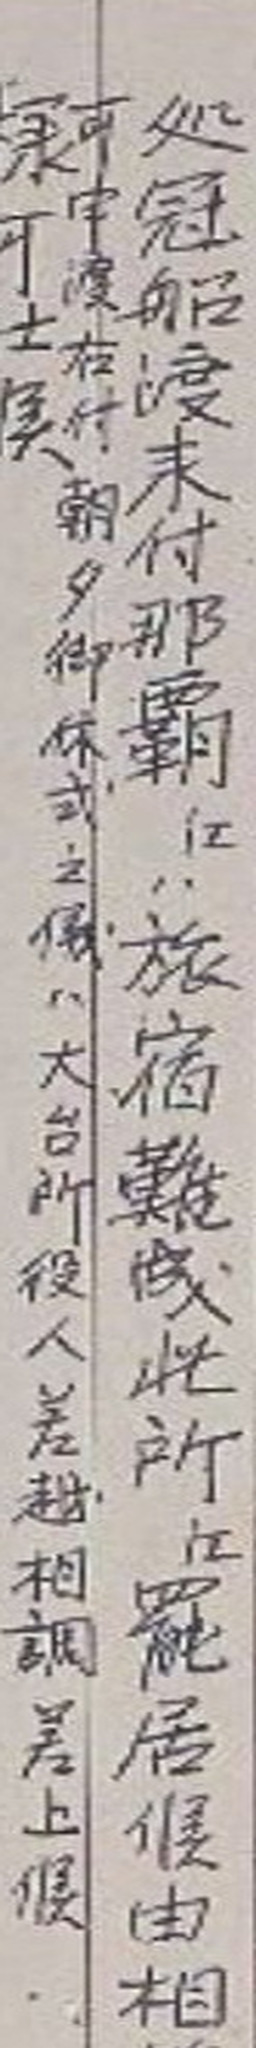可申渡右付朝夕御休式之儀は大台所役人差越相調差上候
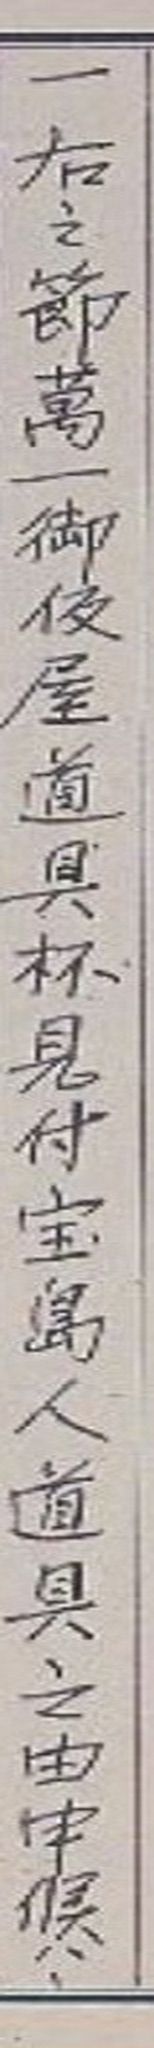一右之節万一御仮屋道具抔見付宝島人道具之由申候はゝ
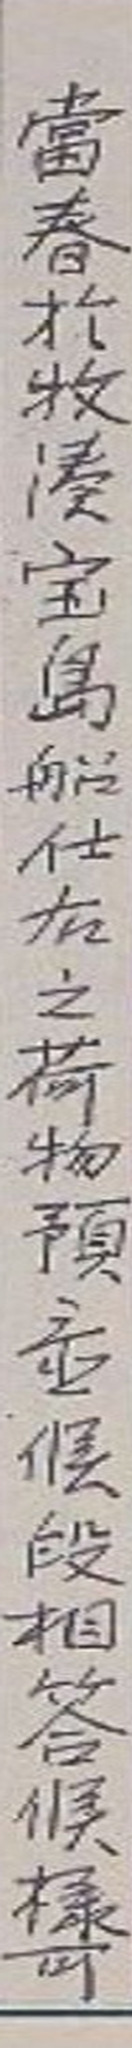当春於牧湊宝島船仕右之荷物預置候段相答候様可
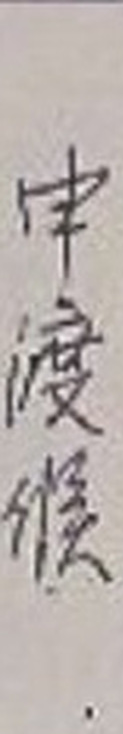申渡候
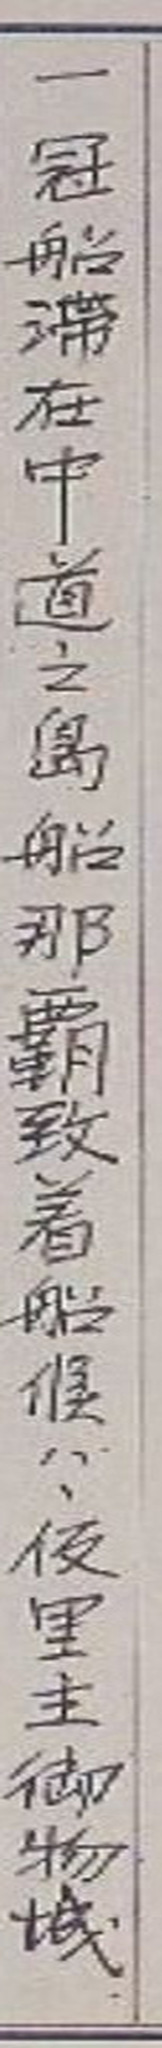一冠船滞在中道之島船那覇致着船候はゝ仮里主御物城
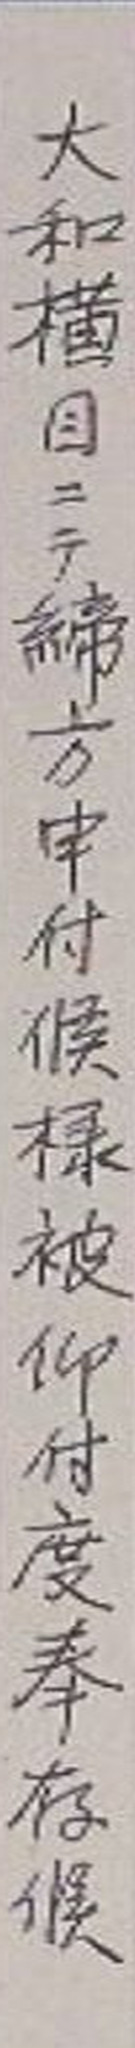大和横目にて締方申付候様被仰付度奉存候

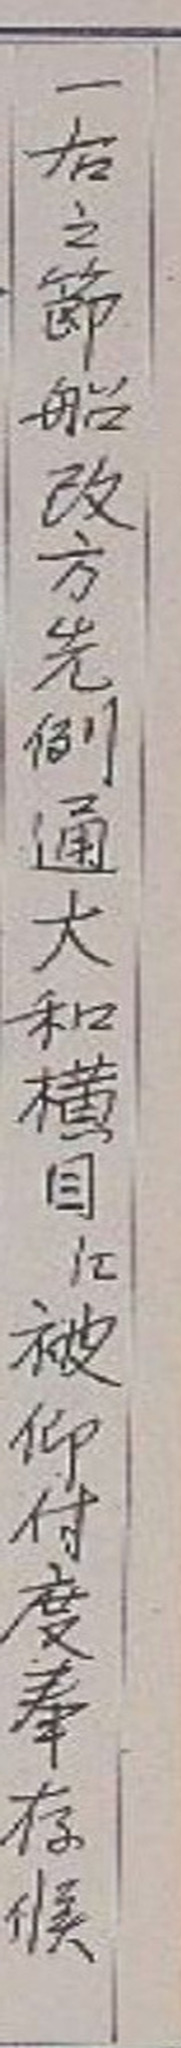一右之節船改方先例通大和横目え被仰付度奉存候
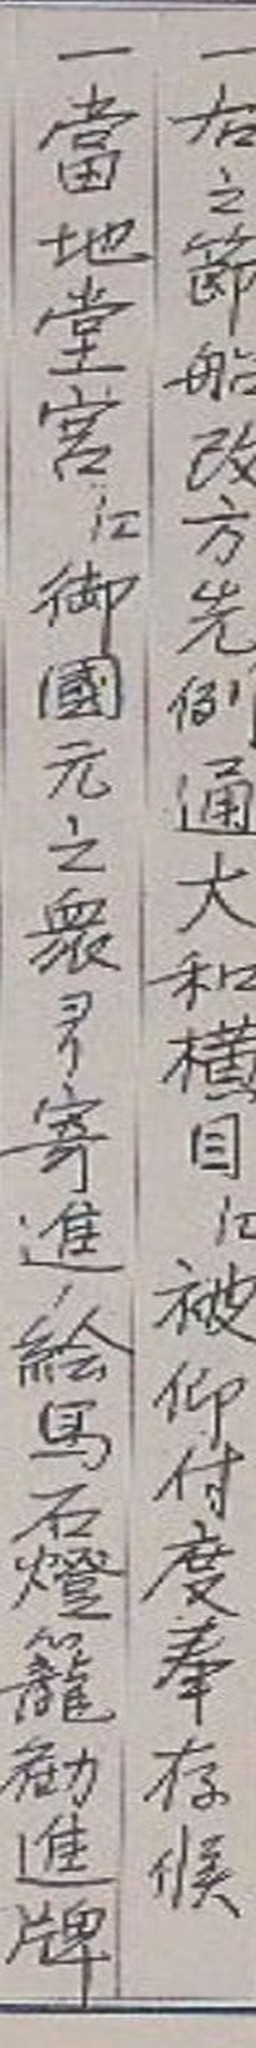一当地堂宮え御国元之衆より寄進の絵馬石灯籠勧進牌
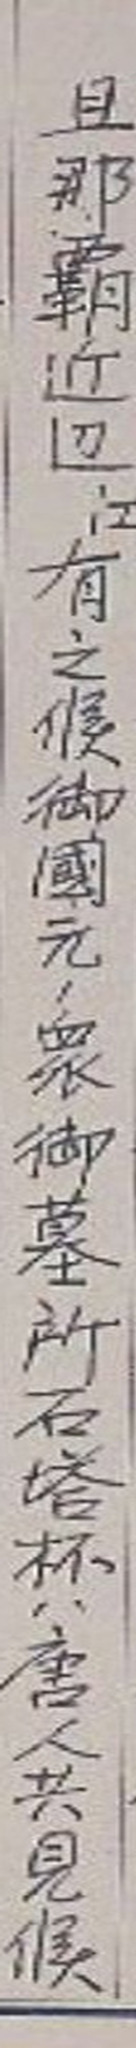且那覇近辺え有之候御国元の衆御墓所石塔抔は唐人共見候
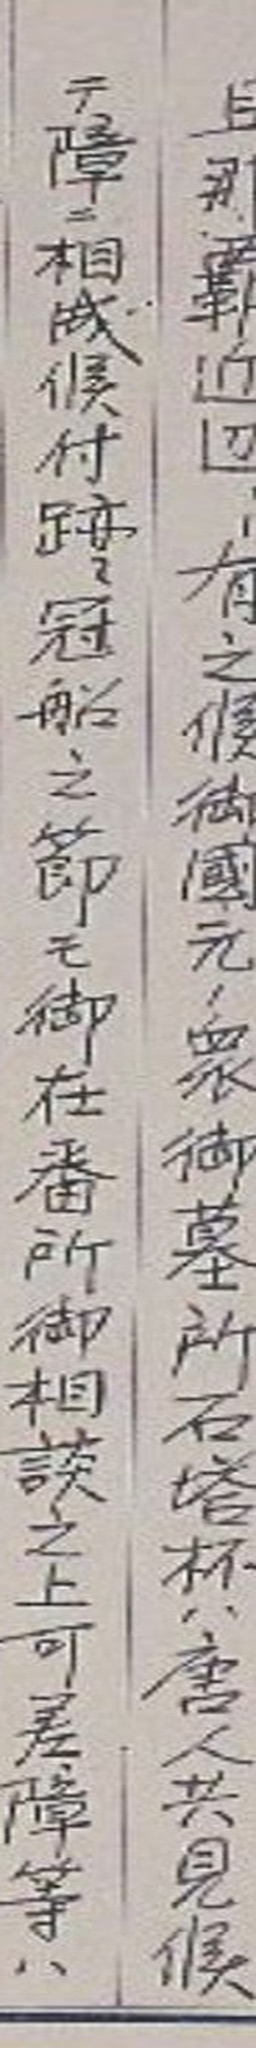て障に相成候付跡々冠船之節も御在番所御相談之上可差障等は
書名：支那冊封使来琉諸記 下巻
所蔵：University of the Ryukyus Library
